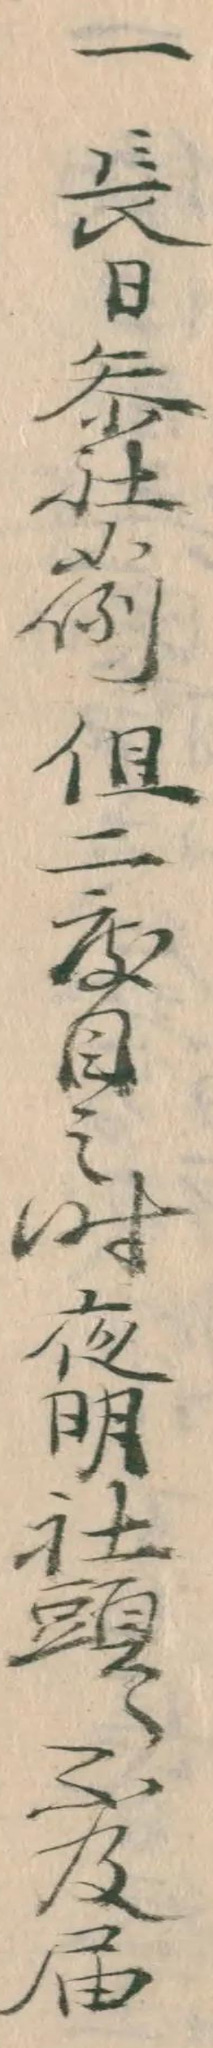一長日参社如例但二度目之時夜明社頭へ不及届
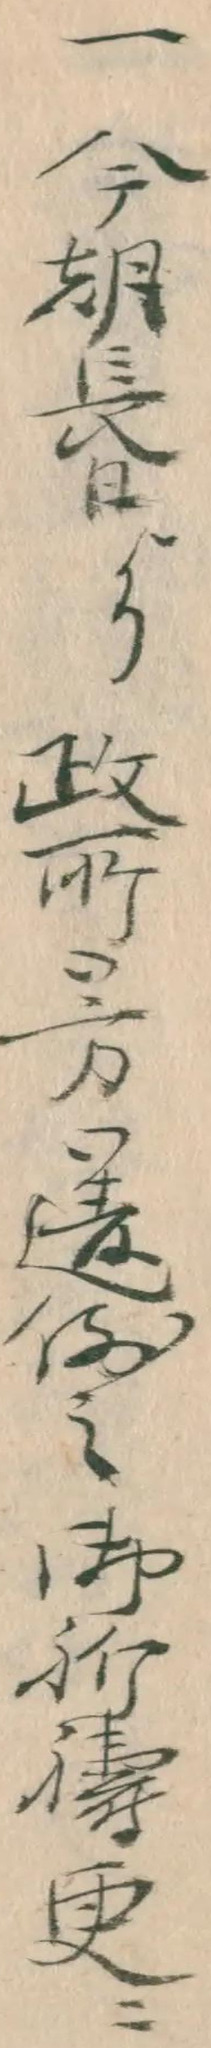一今朝長日より政所御方御違例之御祈祷更ニ
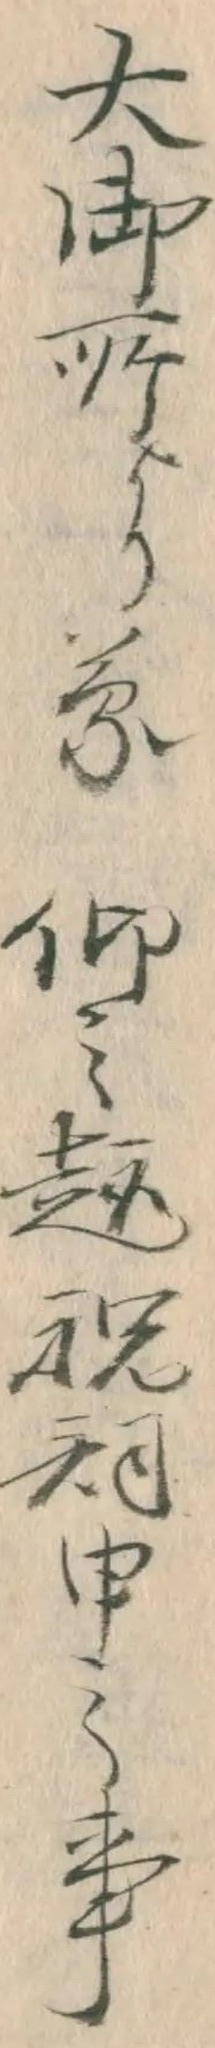大御所より蒙仰之趣祝詞申之事
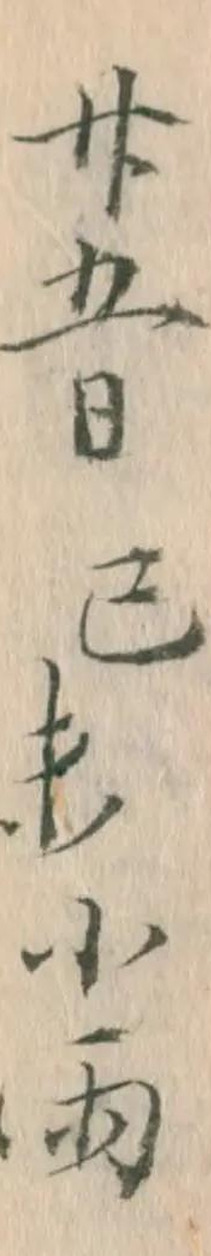廿五日己未小雨
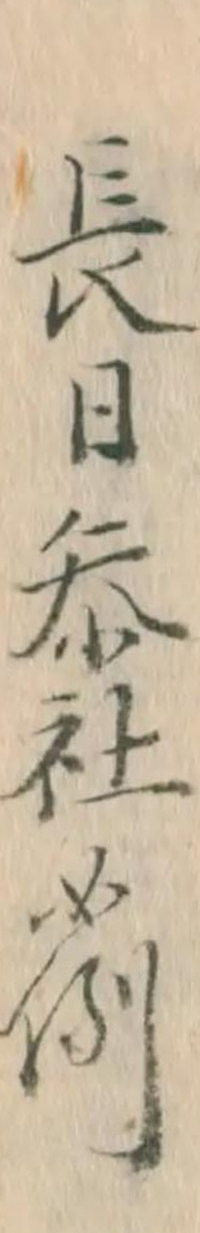一長日参社如例

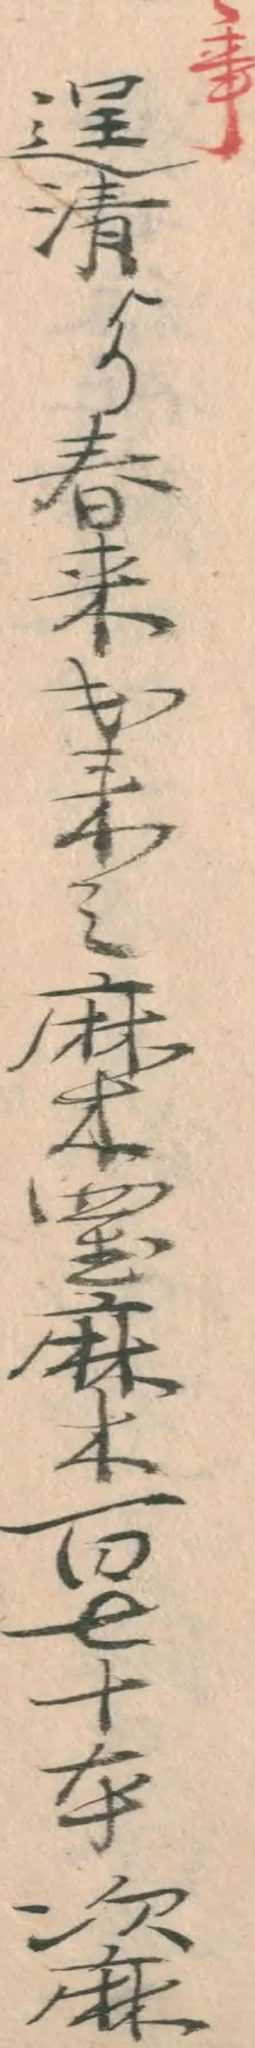一逞清より春来出来之麻木宝麻木百七十本次麻
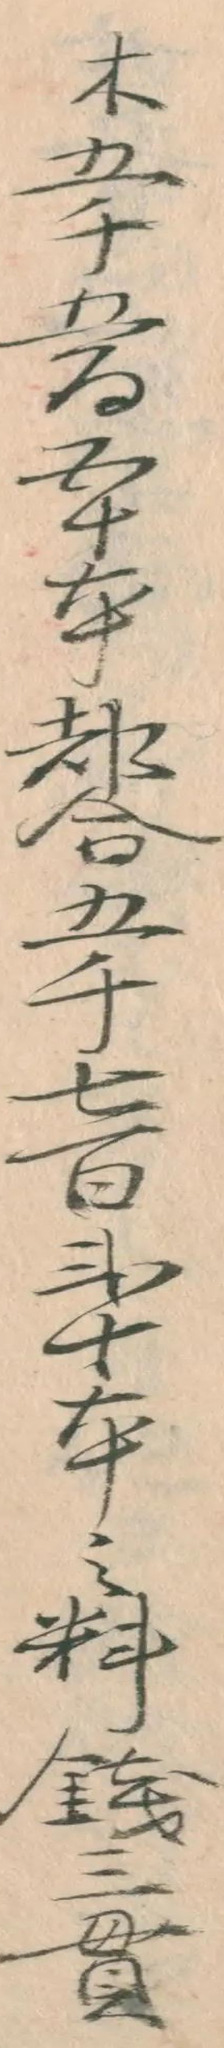木五千五百五十本都合五千七百弐十本之料銭三貫
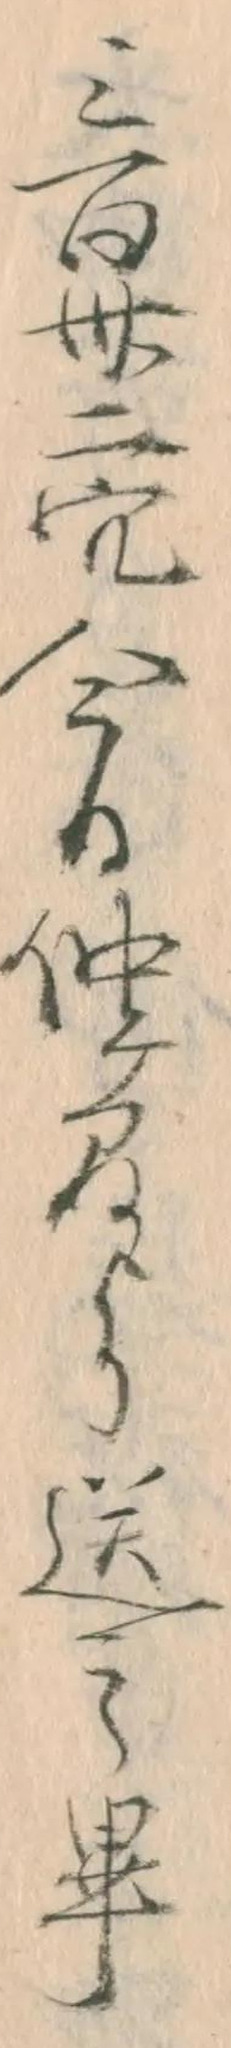三百卅二穴今日仲ヶ間より送之畢
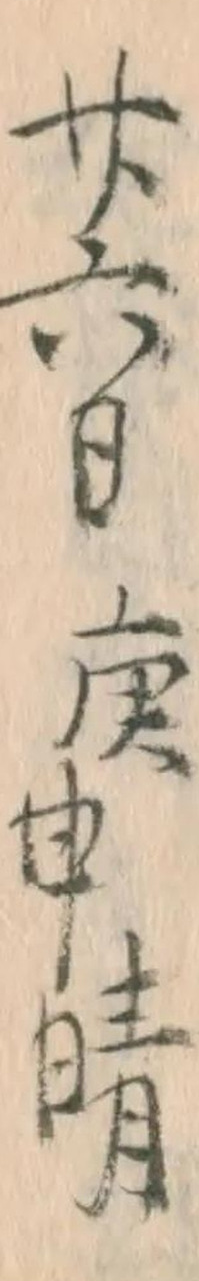廿六日庚申晴
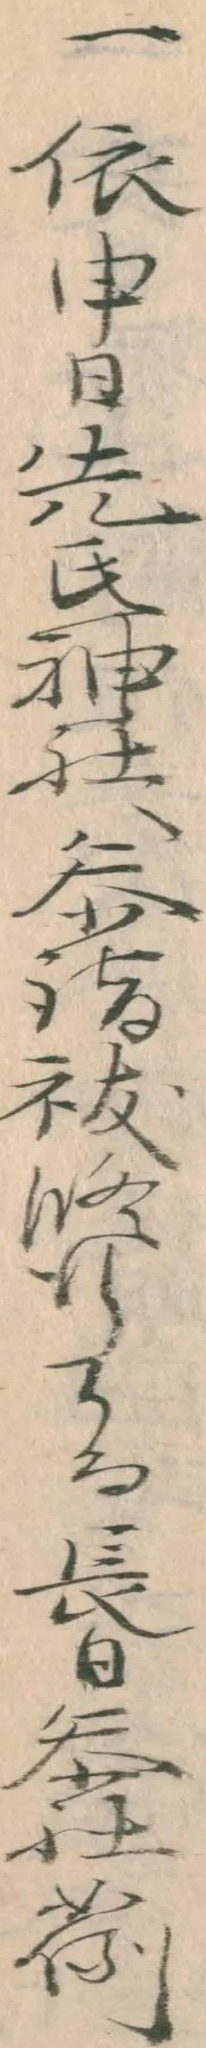一依申日先氏神社へ参詣祓修行了而長日参社如例
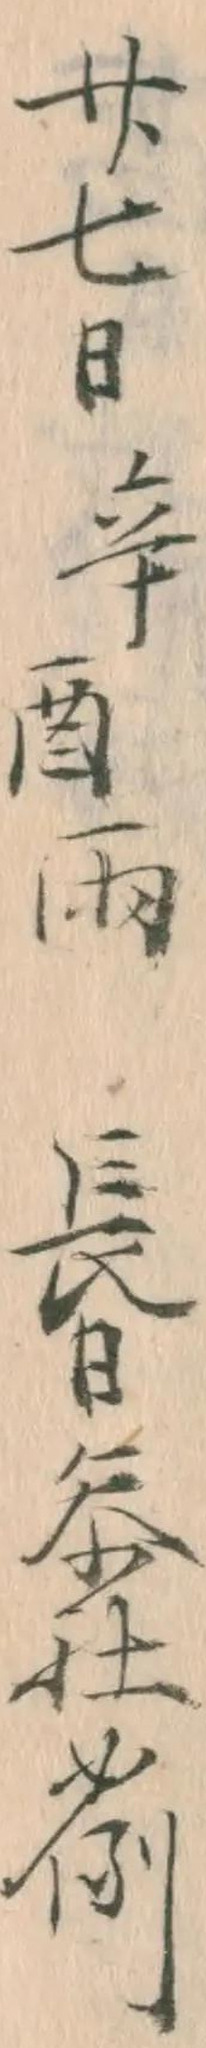廿七日辛酉雨長日参壮如例
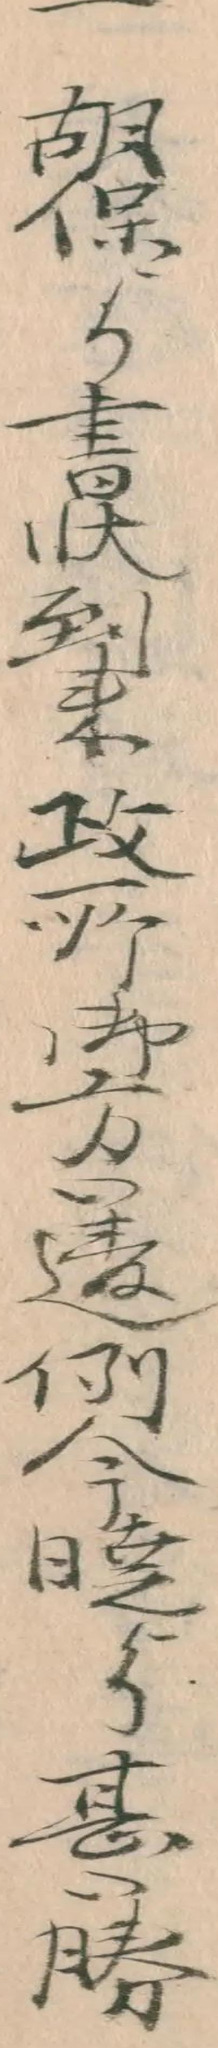一胡保より書状到来政所御方御違例今暁より甚御勝
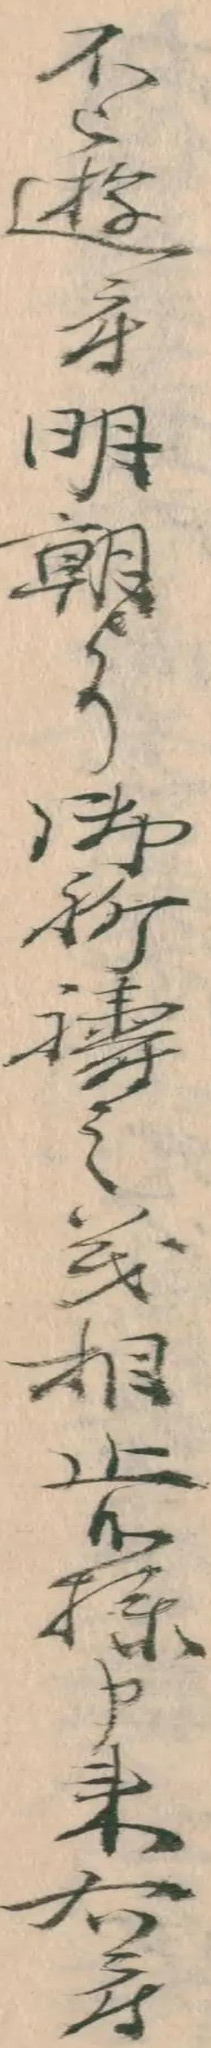不被遊ニ付明朝より御祈祷之義相止候様申来右ニ付
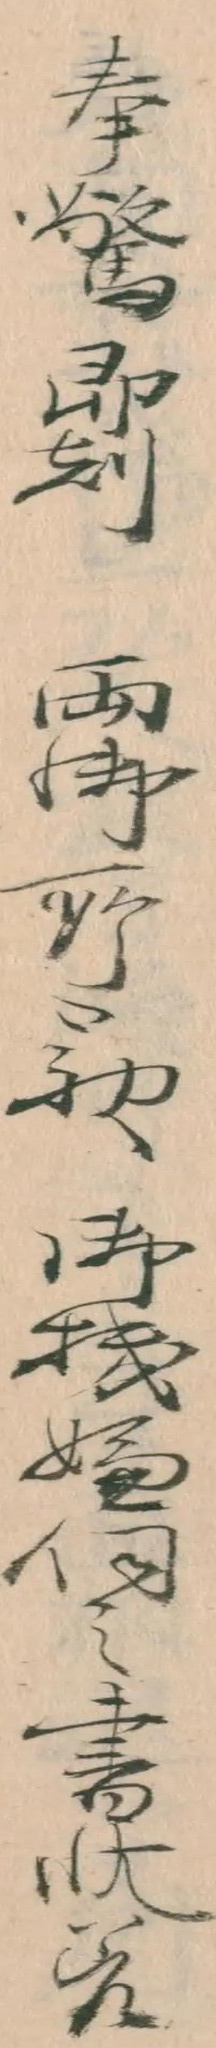奉驚即刻両御所御初へ御機嫌伺之書状差
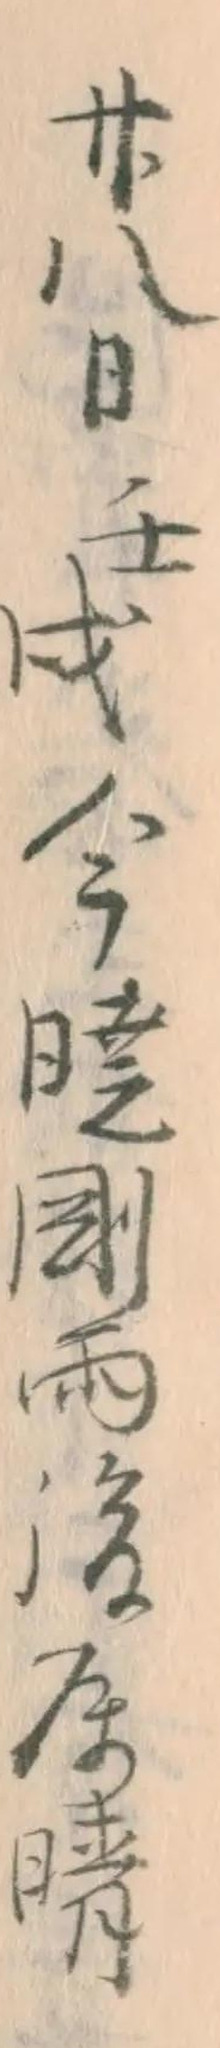廿八日壬戌今暁剛雨後属晴
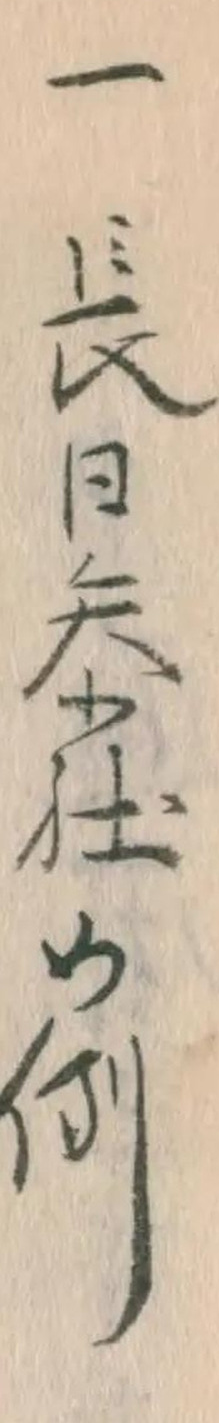一長日参社如例
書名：賀茂社記録. 第72冊
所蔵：国立国会図書館 National Diet Library, JAPAN
